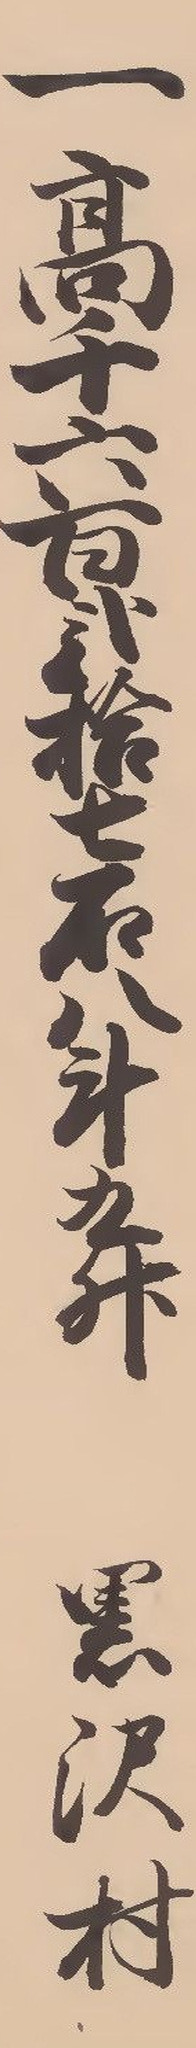一高千六百弐拾七石八斗九升黒沢村
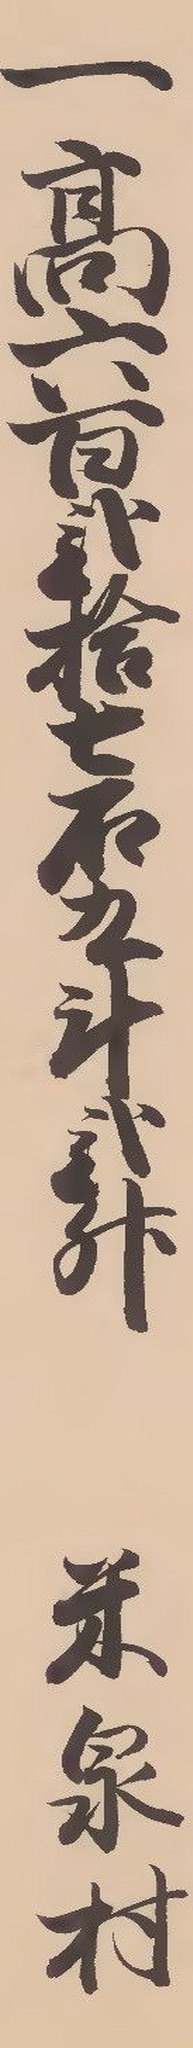一高六百弐拾七石九斗弐升米泉村
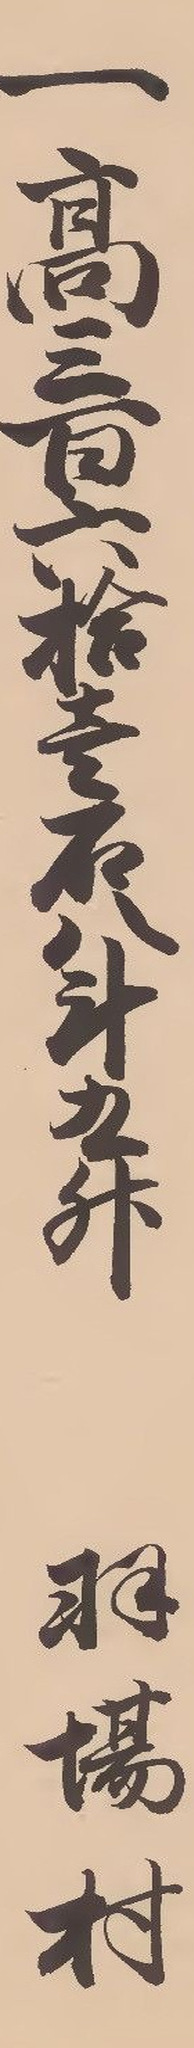一高三百六拾壱石八斗九升羽場村
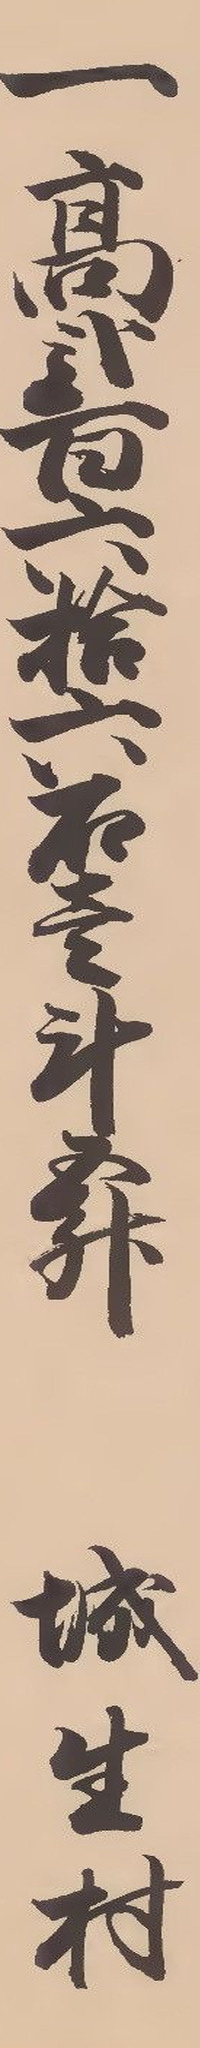一高弐百六拾六石壱斗五升城生村
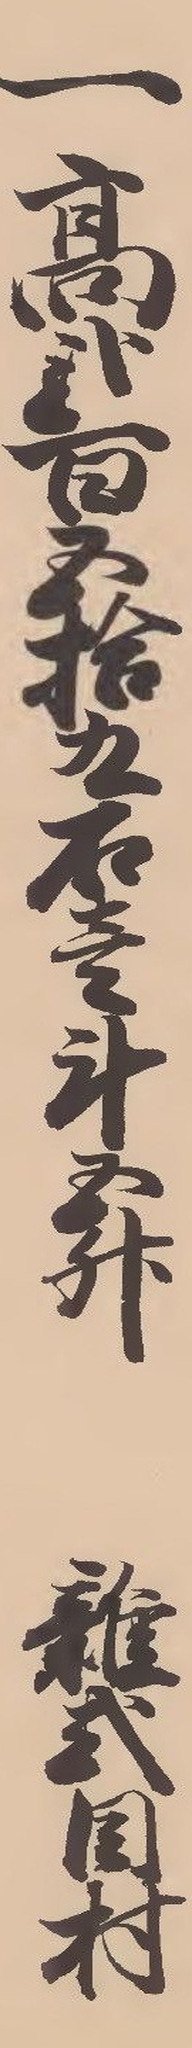一高弐百五拾九石壱斗五升雑式目村
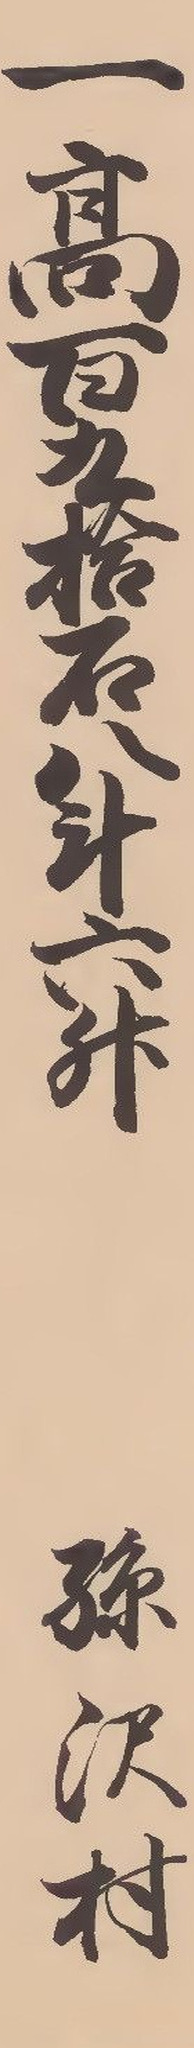一高百九拾石八斗六升孫沢村
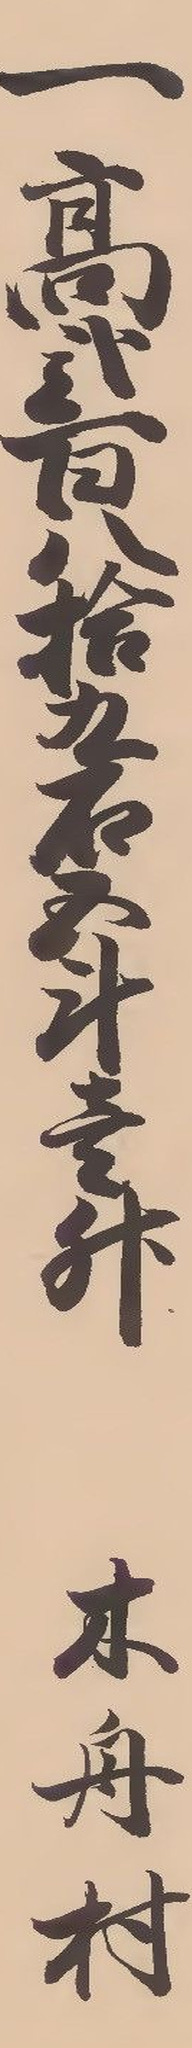一高弐百八拾九石五斗壱升木舟村

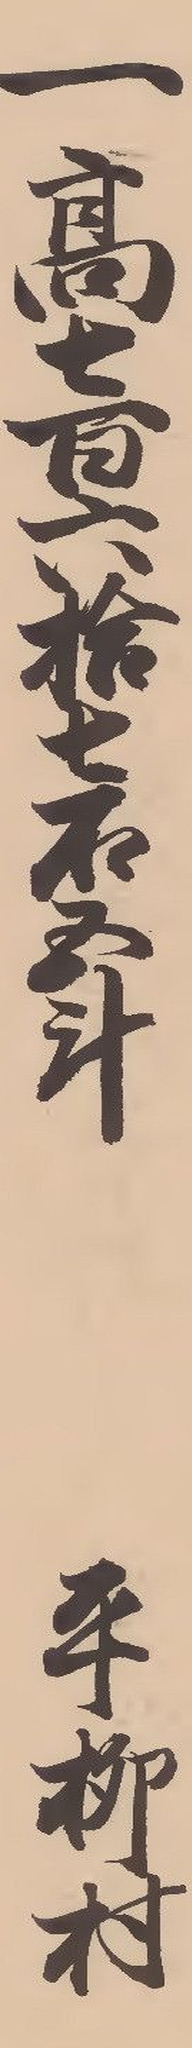一高七百六拾七石五斗平柳村
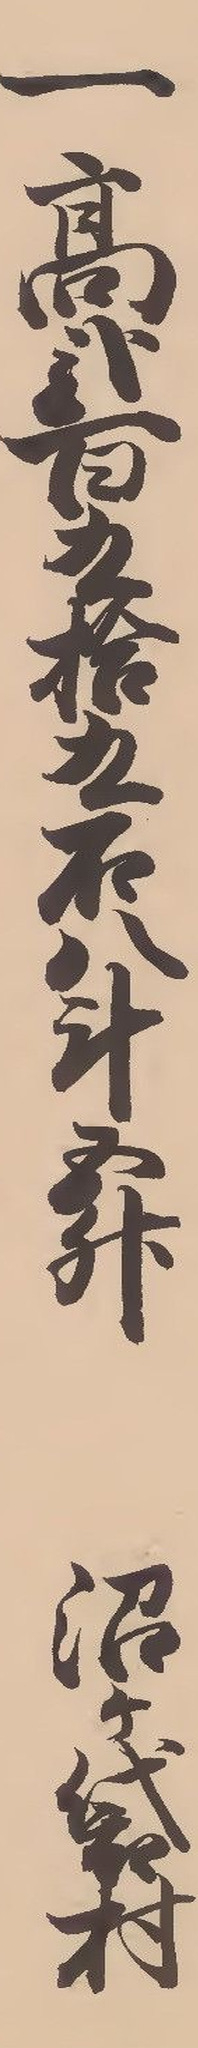一高弐百九拾九石八斗五升沼ヶ袋村
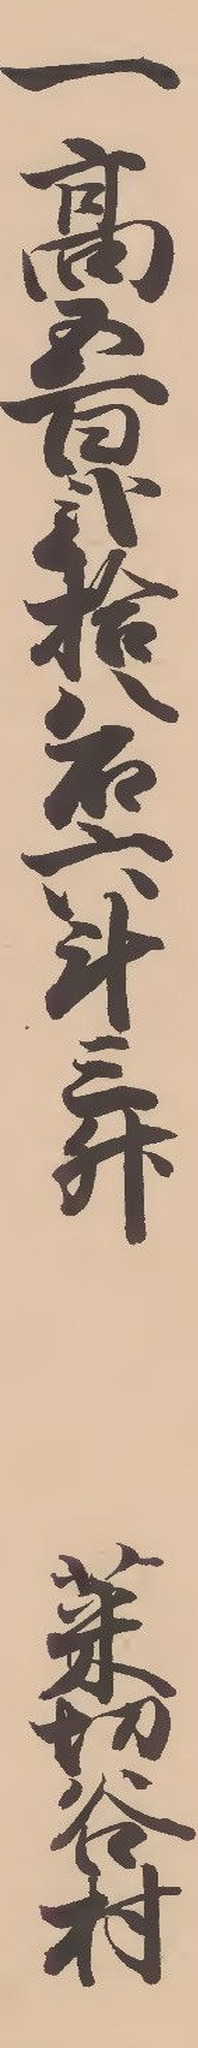一高五百弐拾八石六斗三升菜切谷村
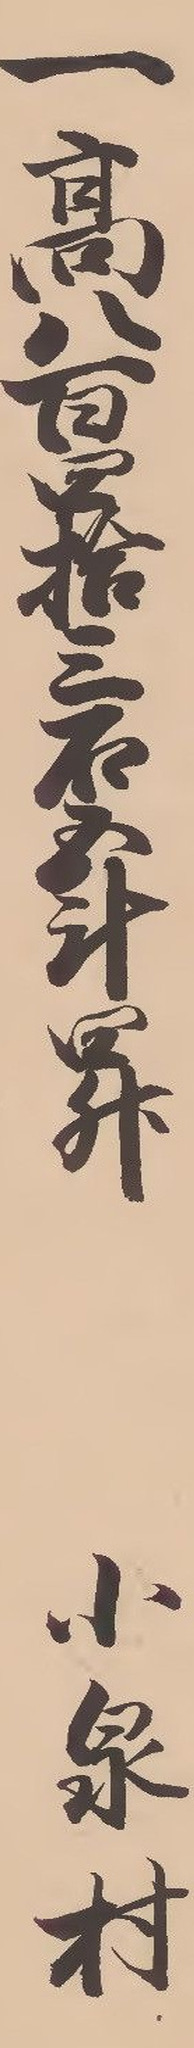一高八百四拾三石五斗四升小泉村
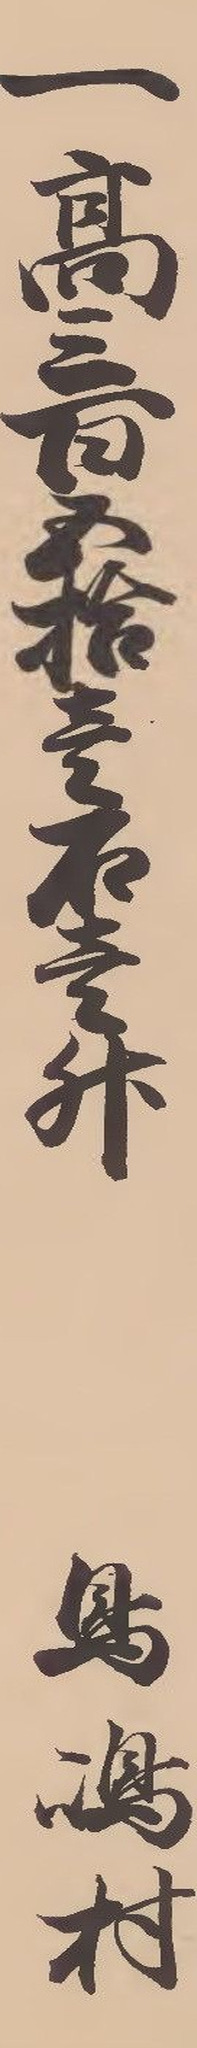一高三百五拾壱石壱升鳥島村
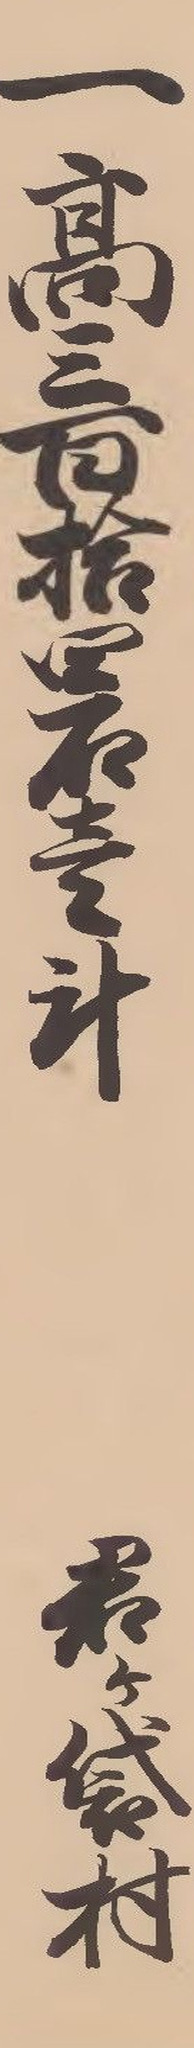一高三百拾四石壱斗君ヶ袋村
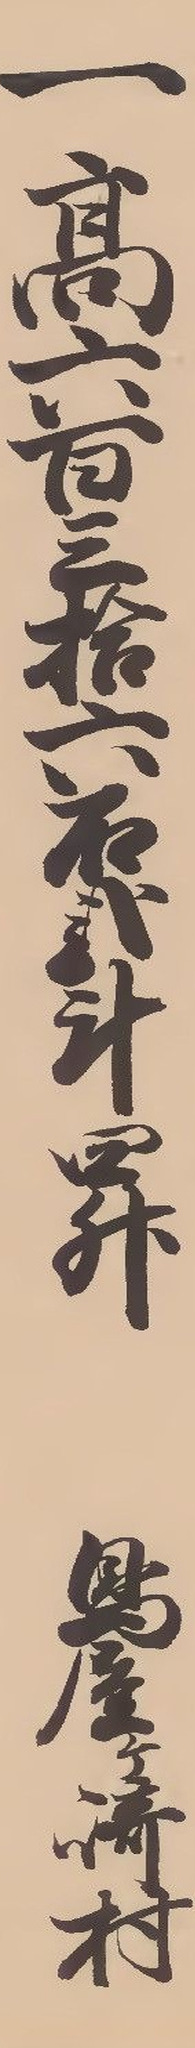一高六百三拾六石弐斗四升鳥屋ヶ崎村
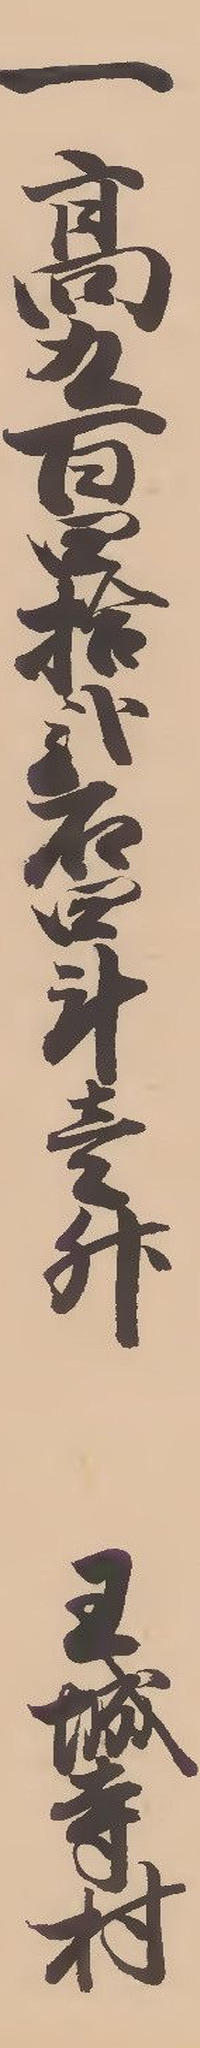一高九百四拾弐石四斗壱升王城寺村

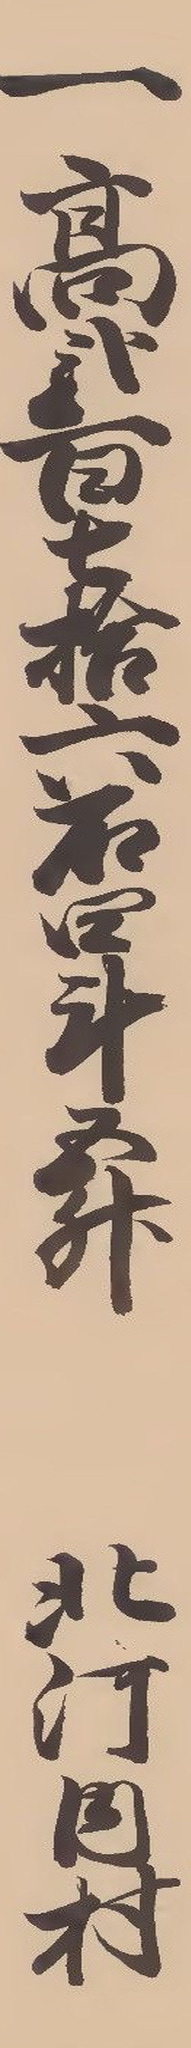一高弐百七拾六石四斗五升北河内村
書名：陸奥国郷帳　５
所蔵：国立公文書館 National Archives of Japan
